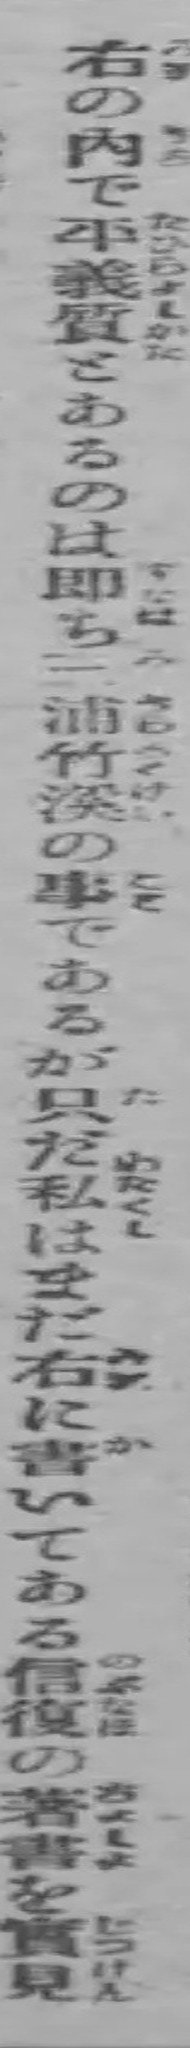右の内で平義質とあるのは即ち三浦竹渓の事であるが只だ私はまだ右に書いてある信復の著書の実見
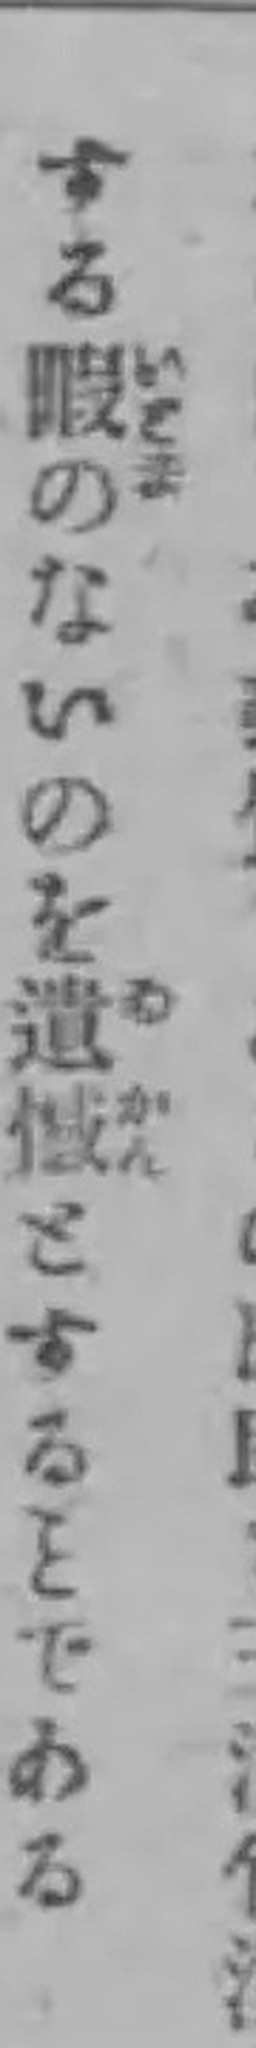する暇のないのを遺憾とすることである
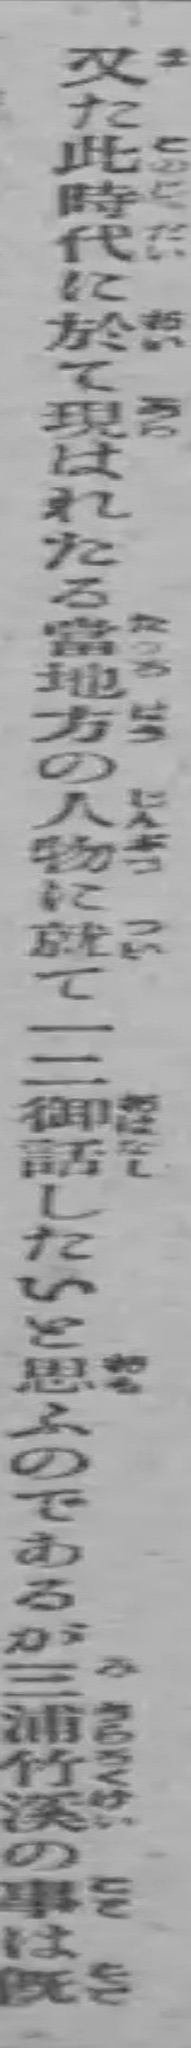又た此時代に於て現はれたる当地方の人物に就て一二御話したいと思ふのであるが三浦竹渓の事は既
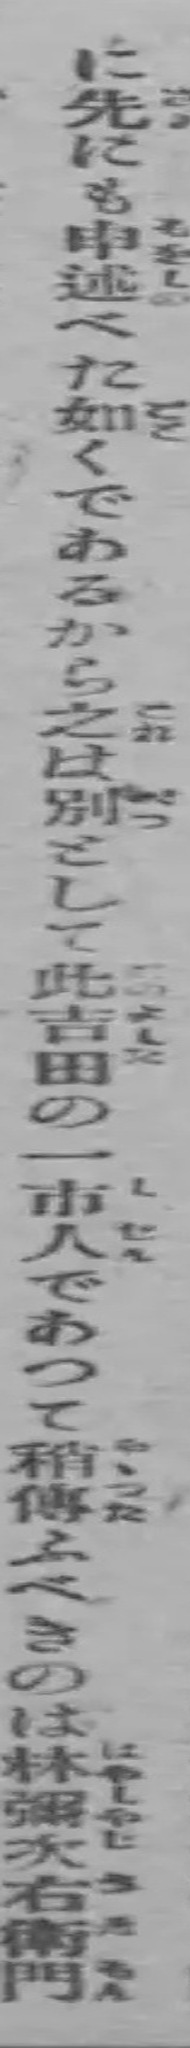林正森に先にも申述べた如くであるから之は別として此吉田の一市人であつて稍伝ふべきのは林弥次右衛門
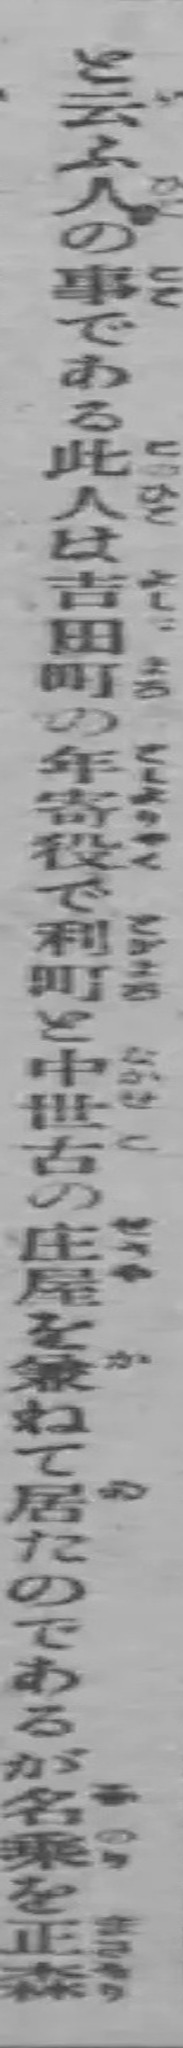と云ふ人の事である此人は吉田町の年寄役で利町と中世古の庄屋を兼ねて居たのであるが名乗を正森
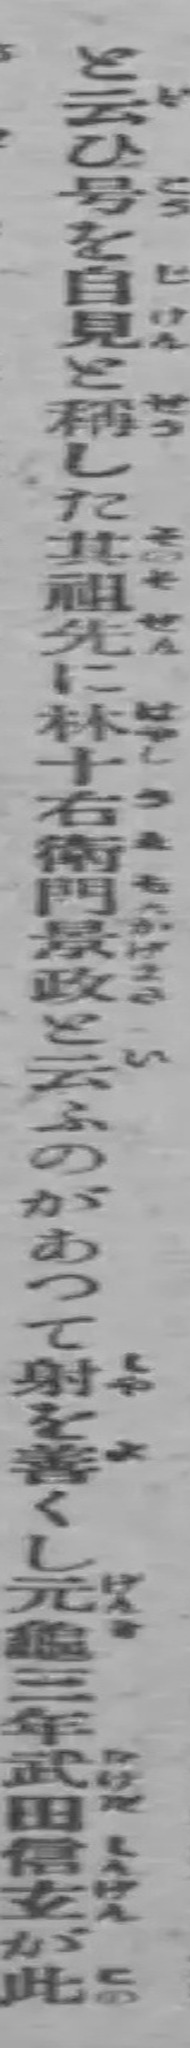と云ひ号を自見と称した其祖先に林十右衛門景政と云ふのがあつて射を善くし元亀三年武田信玄が此
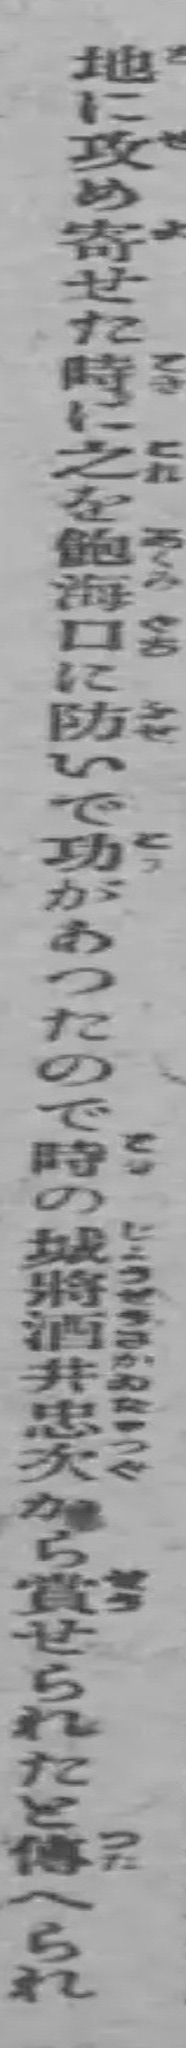地に攻め寄せた時に之を飽海口に防いで功があつたので時の城将酒井忠次から賞せられたと伝へられ
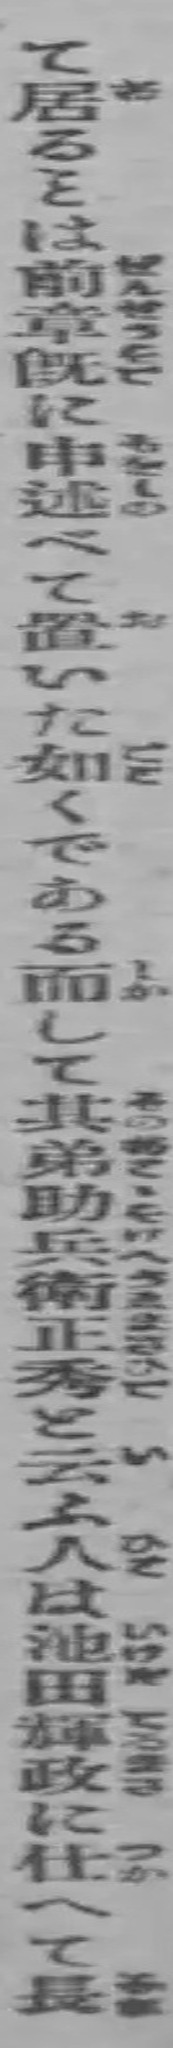て居ることは前章既に申述べて置いた如くである而して其弟助兵衛正秀と云ふ人は池田輝政に仕へて長
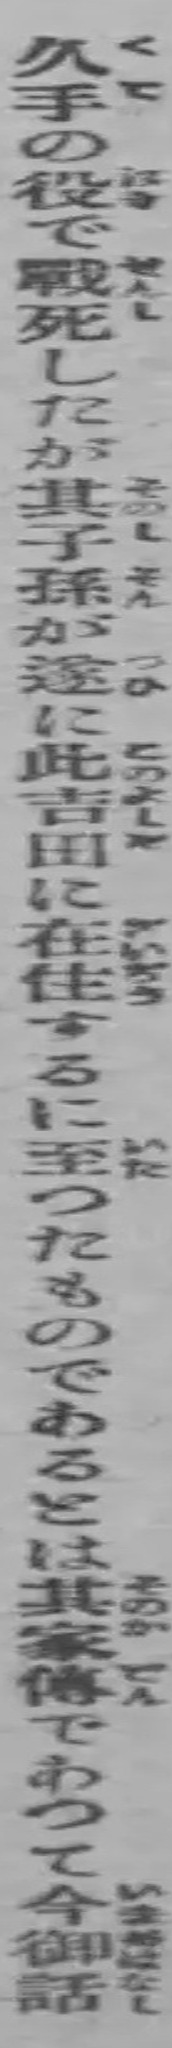久手の役で戦死したが其子孫が遂に此吉田に在住するに至つたものであるとは其家伝であつて今御話
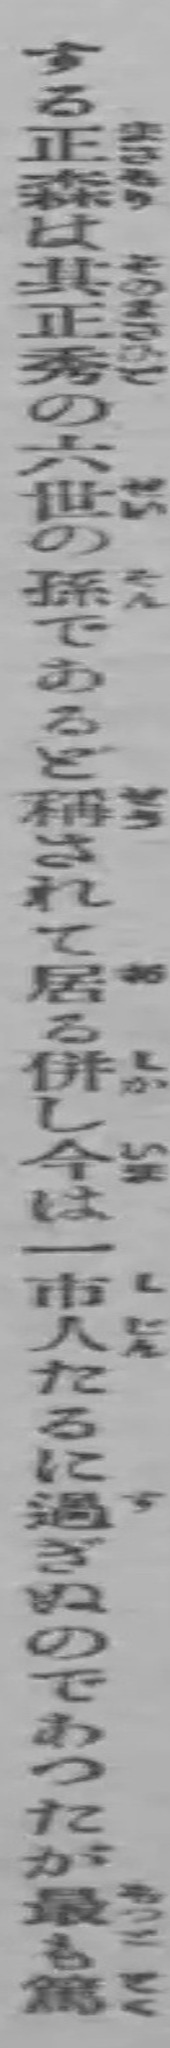する正森は其正秀の六世の孫であると称されて居る併し今は一市人たるに過ぎぬのであつたが最も篤
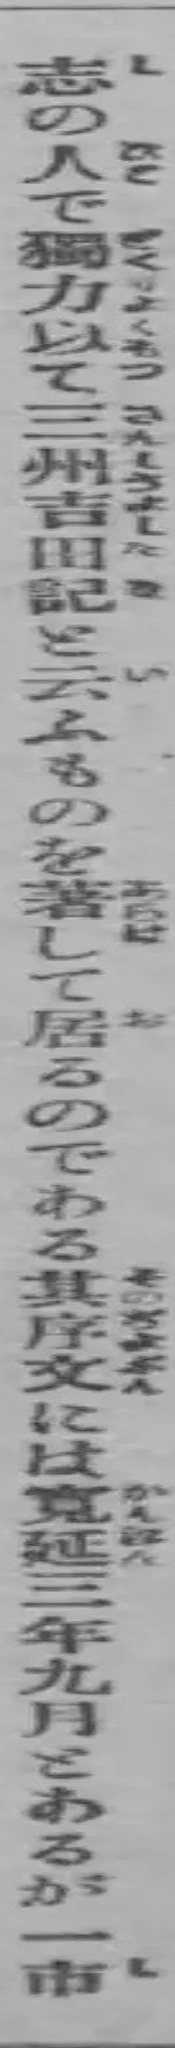志の人で独力以て三州吉田記と云ふものを著して居るのである其序文には寛延三年九月とあるが一市
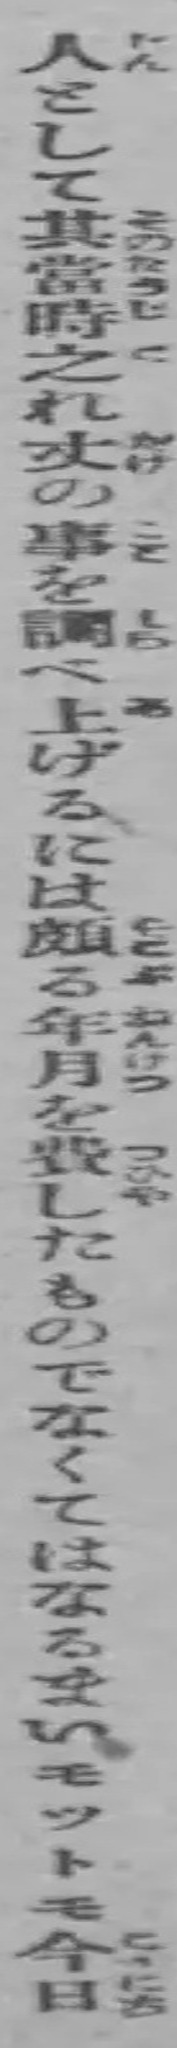人として其当時之れ丈の事を調べ上げるには頗る年月を費したものでなくてはなるまいモツトモ今日
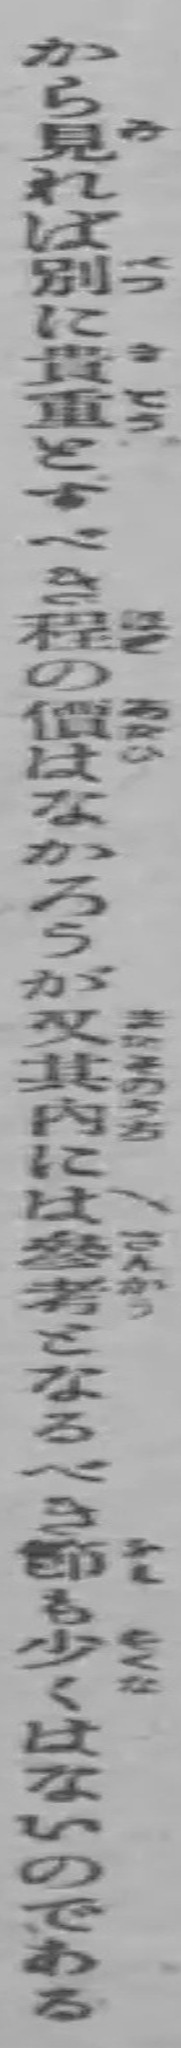から見れば別に貴重とすべき程の値はなかろうが又其内には参考となるべき節も少なくないのである
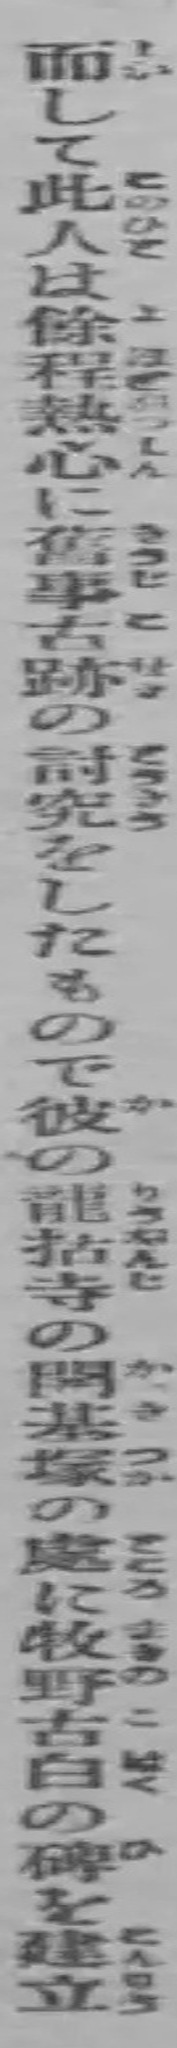而して此人は余程熱心に旧事古跡の討究をしたもので彼の龍拈寺の開基塚の処に牧野古白の碑を建立
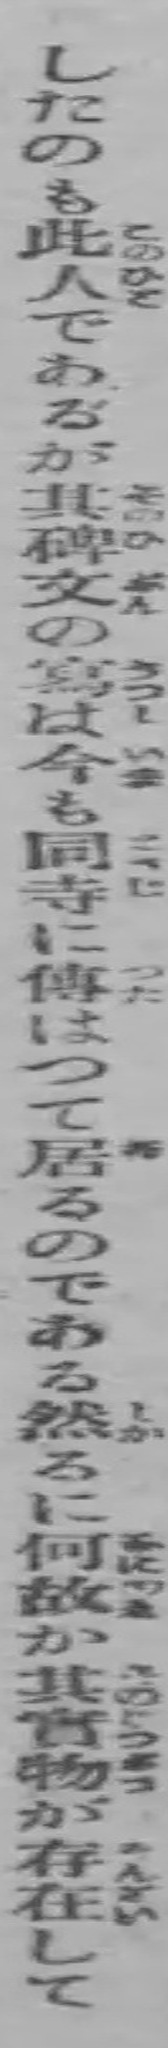したのも此人であるが其碑文の写は今も同寺に伝はつて居るのである然るに何故か其実物が存在して
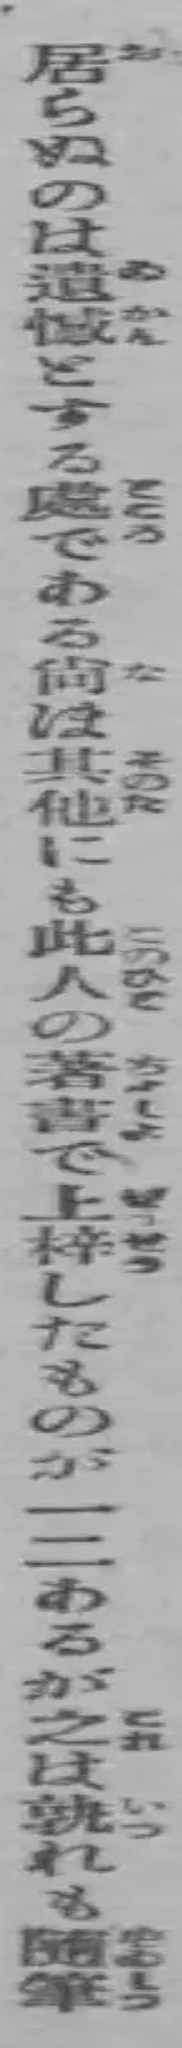居らぬのは遺憾とする処である尚ほ其他にも此人の著書で上梓したものが一二あるが之は孰れも随筆
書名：豊橋市史談
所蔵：国立国会図書館 National Diet Library, JAPAN
